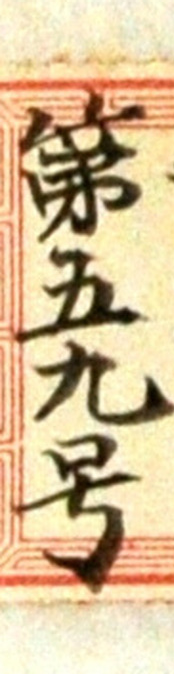第五九号
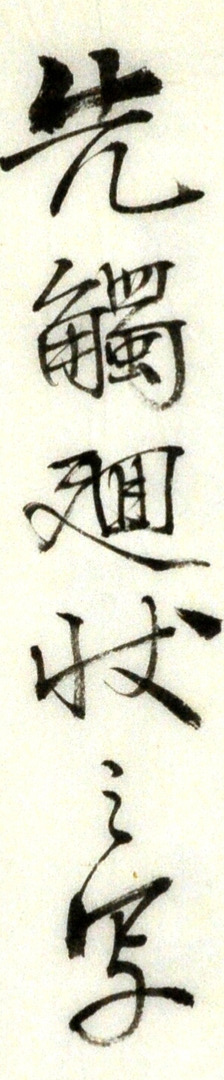先触廻状之写

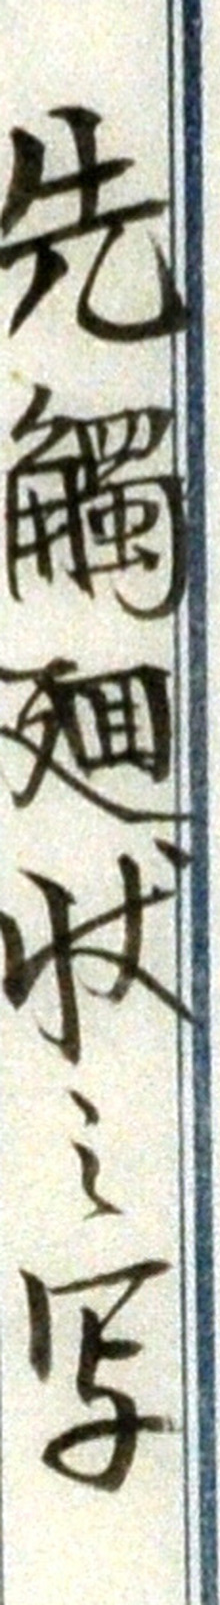先触廻状之写
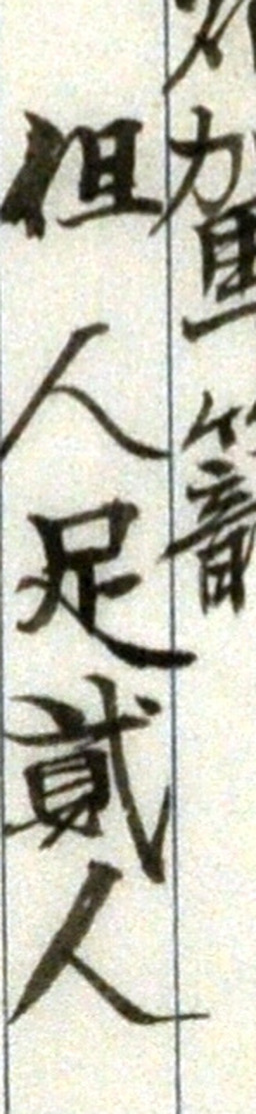但人足貮人
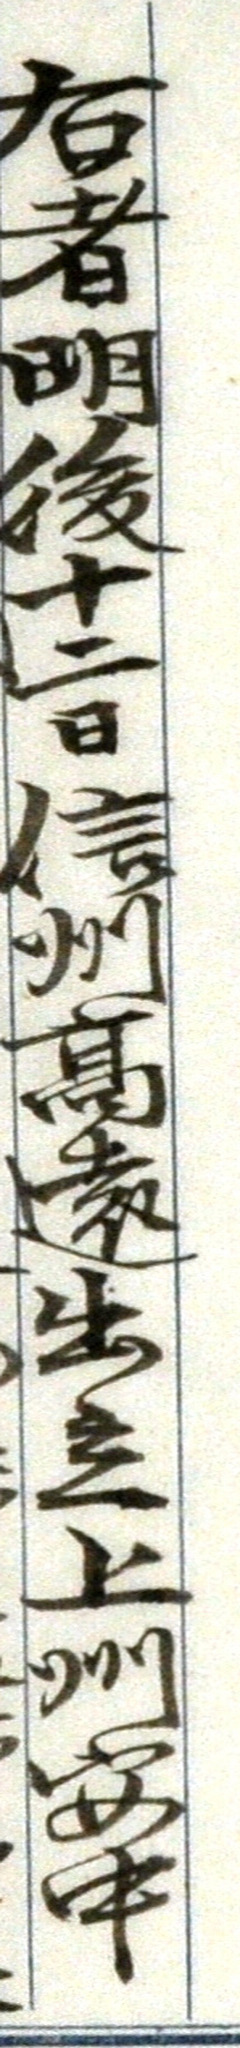右者明後十二日信州高遠出立上州安中
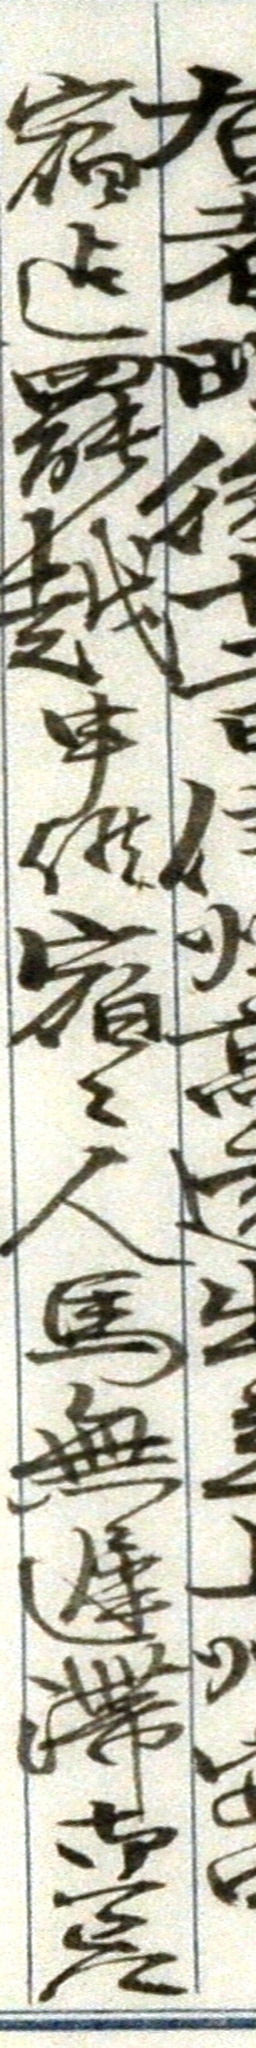宿迄罷越申候宿々人馬無遅滞御差
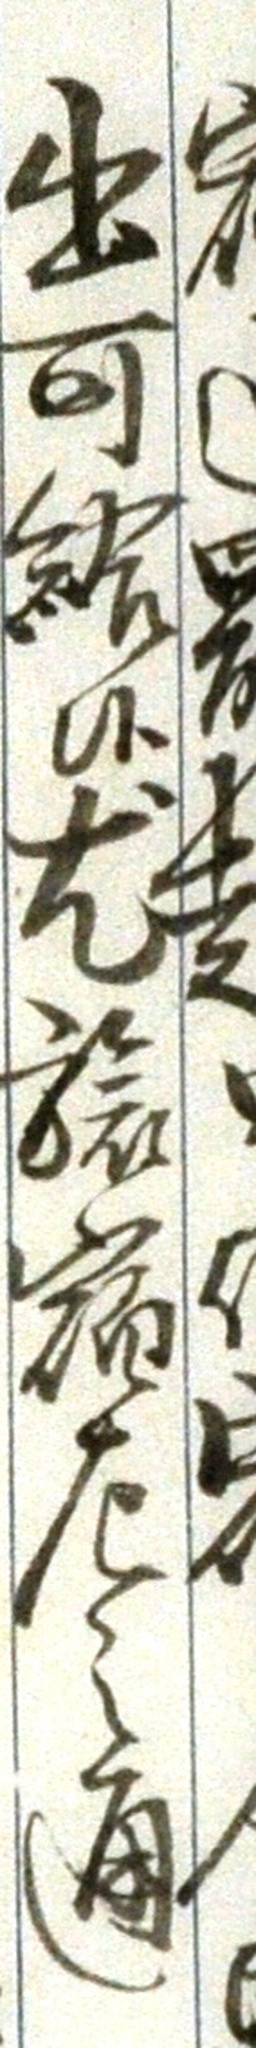出可給候尤旅宿左之通

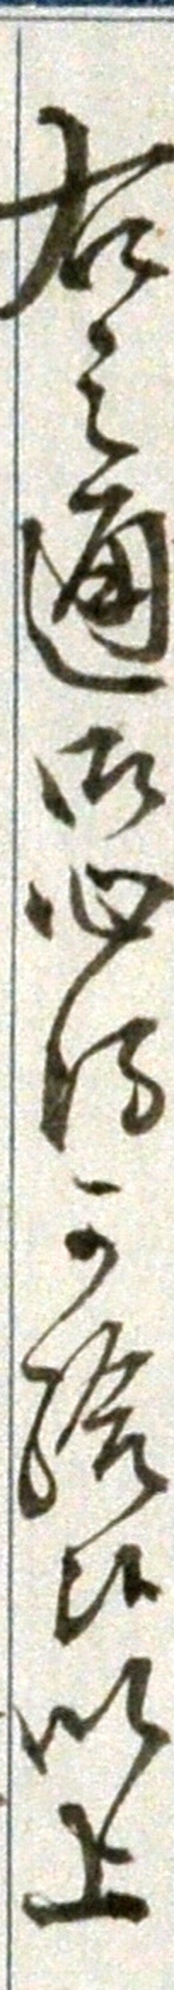右之通御心得可給候以上
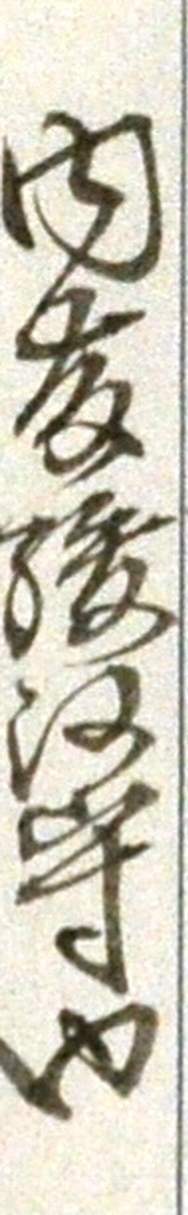内藤駿河守内
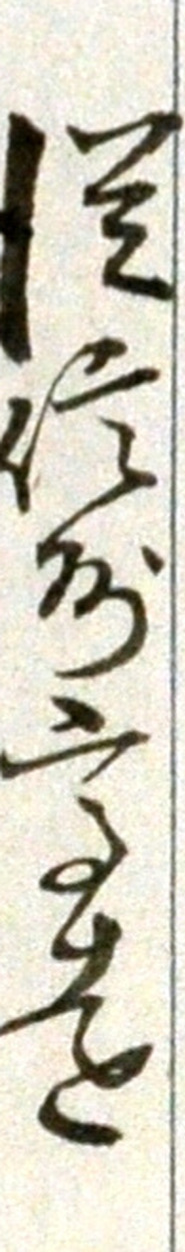従信州高遠
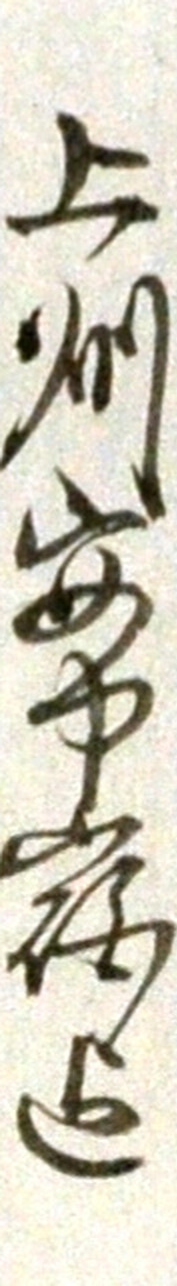上州安中宿迄
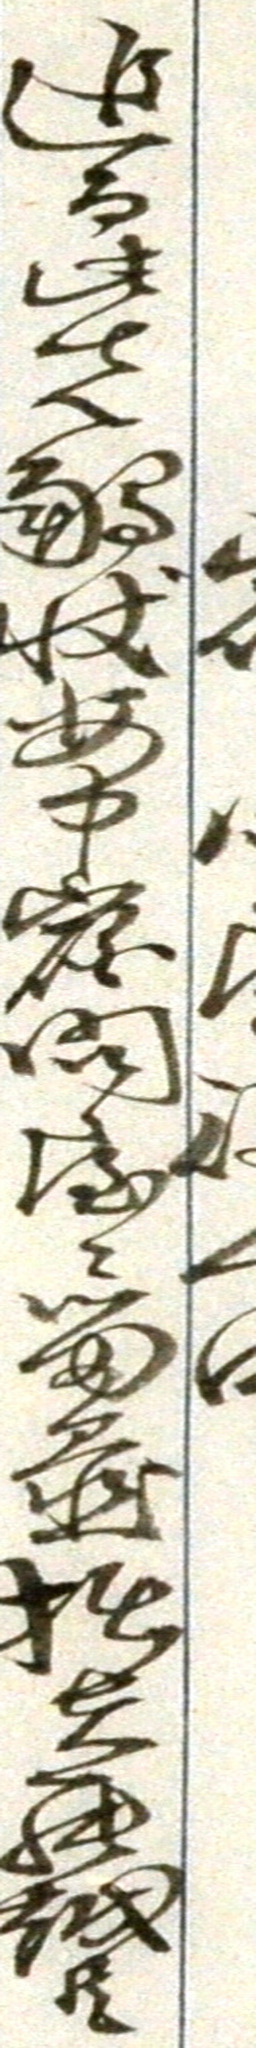追而此先触状安中宿問屋ニ留置拙者罷越候
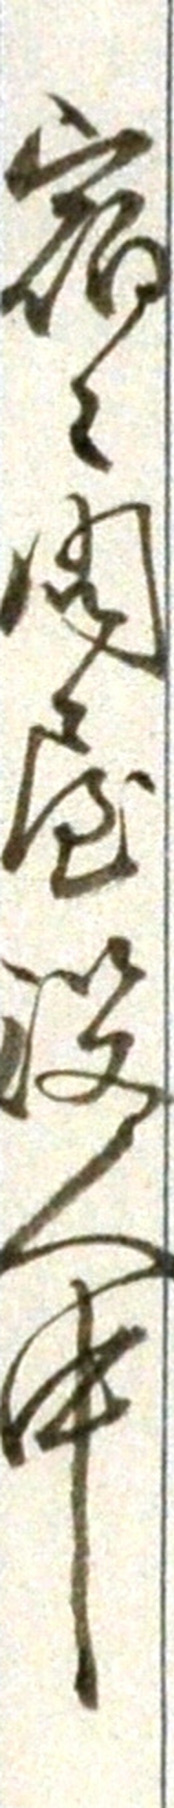宿々問屋役人中
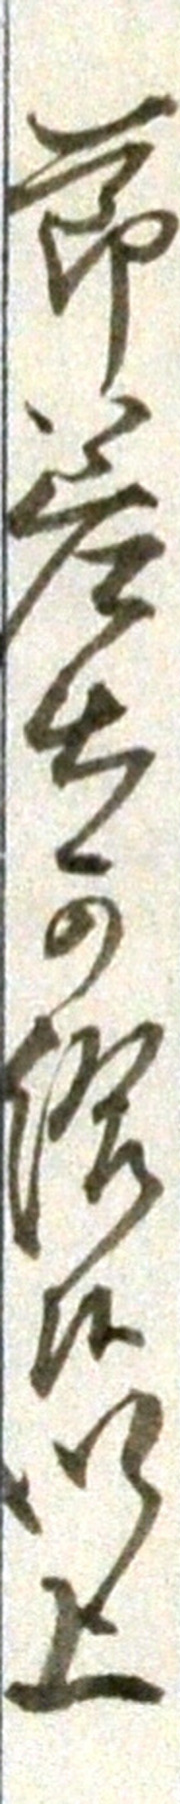節差出可給候以上
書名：先触廻状之写
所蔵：伊那市立高遠町図書館・合同会社AMANE
